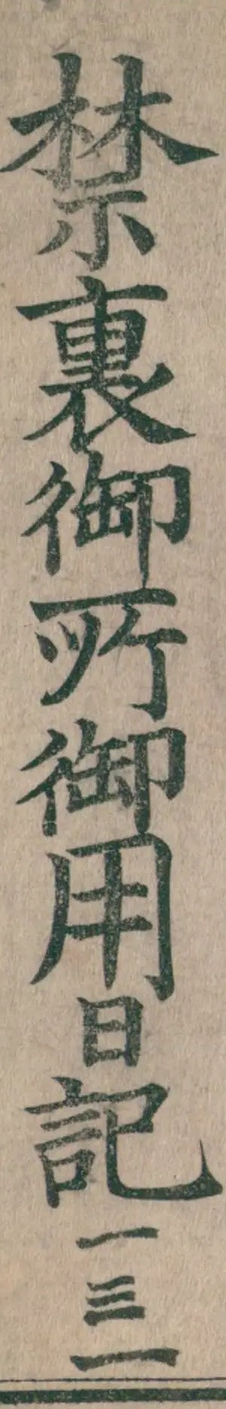禁裏御所御用日記一三一

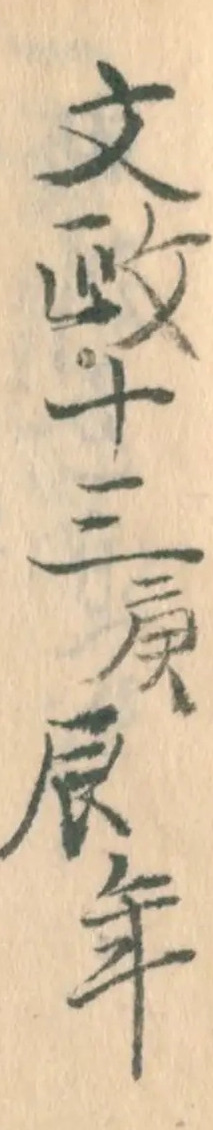文政十三庚辰年
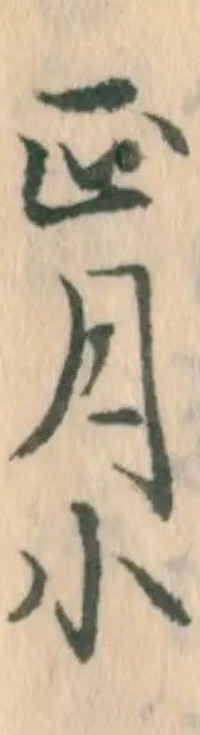正月小
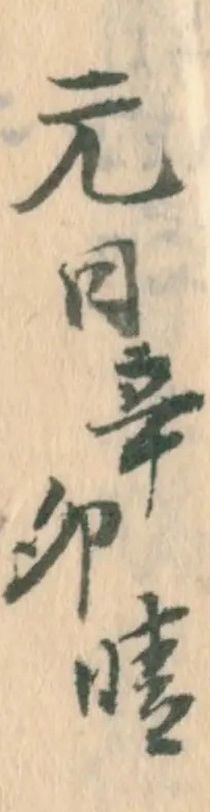元日辛卯晴
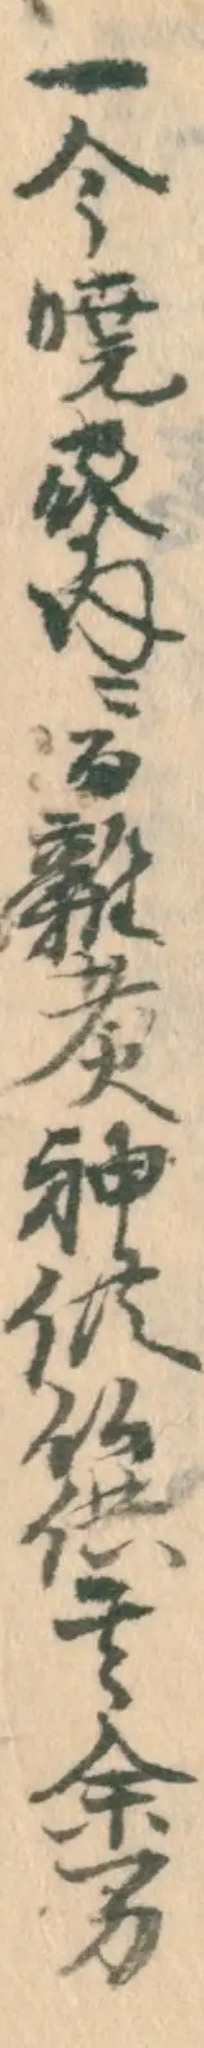一今暁家内ニ而雑煮神供仏供其余万
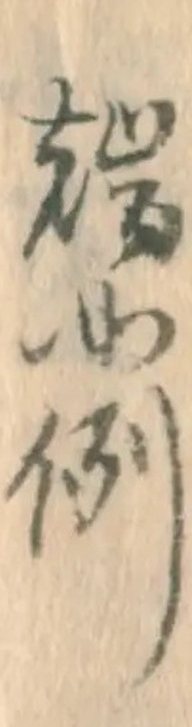端如例
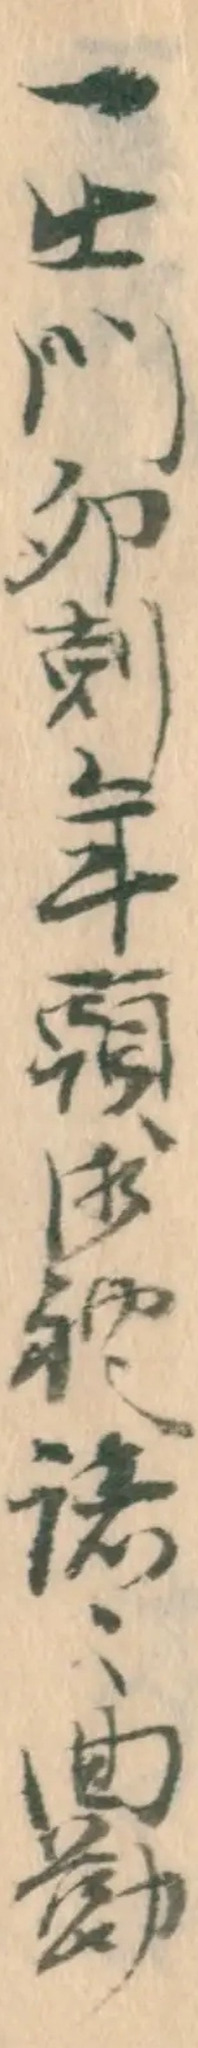一出門卯刻年頭御礼諸々回勤
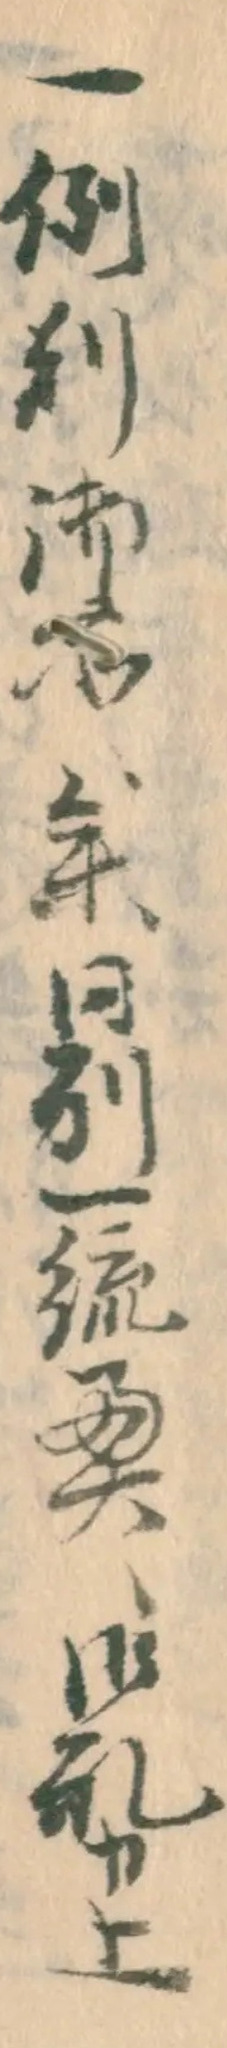一例刻御所へ参同列一統奥へ御礼申上
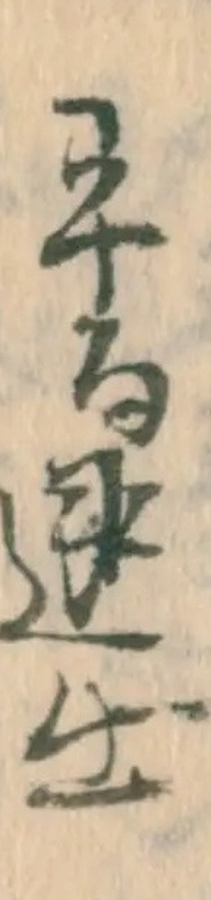畢而退出
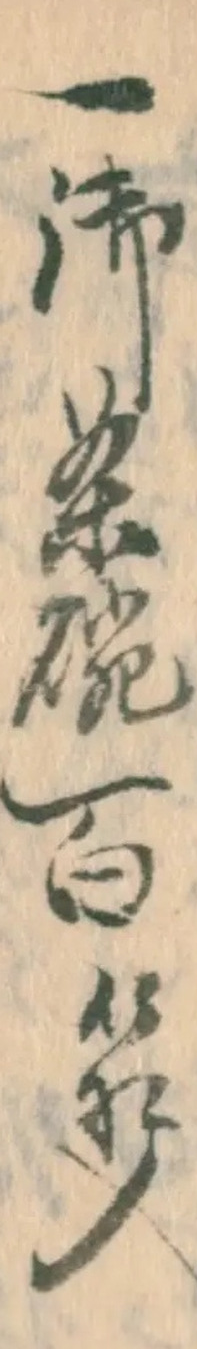一御茶碗百箱入
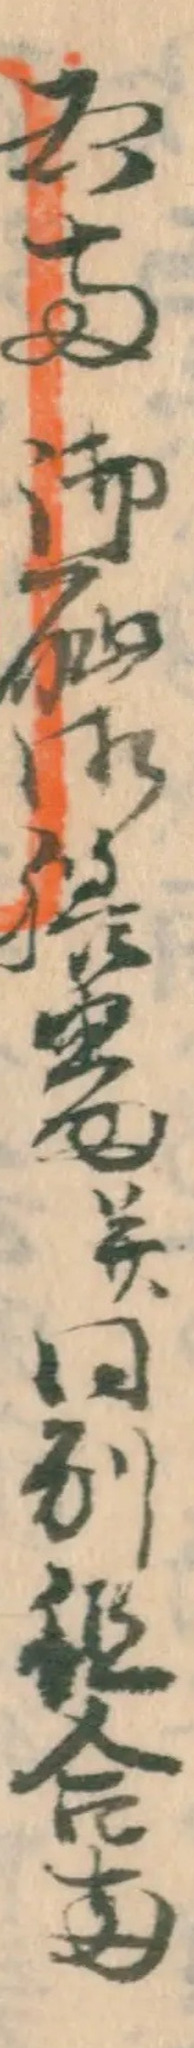右両御所御膳番并同列組合両
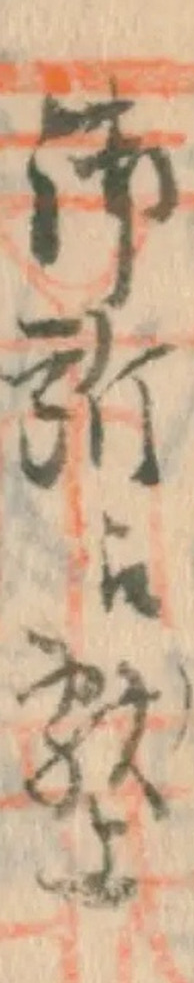御所え献上
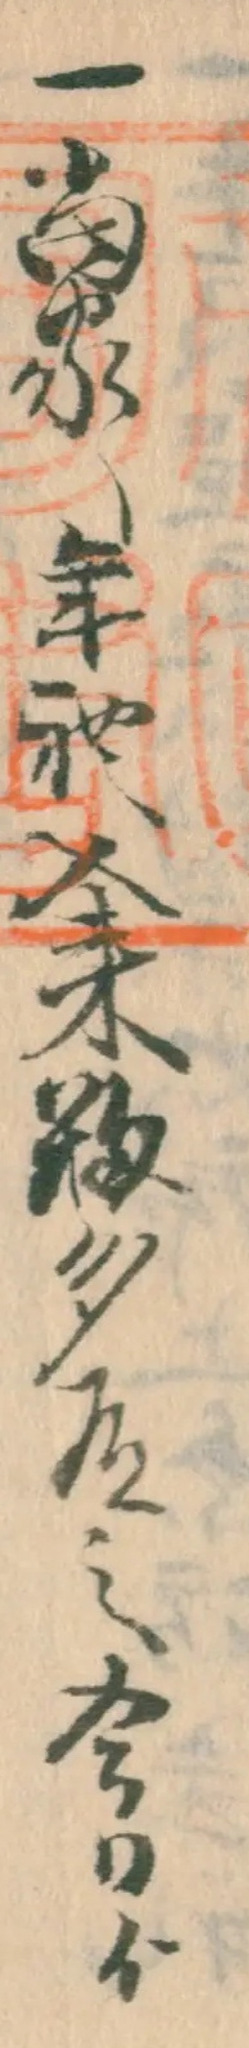一当家へ年礼入来数多有之今日ゟ
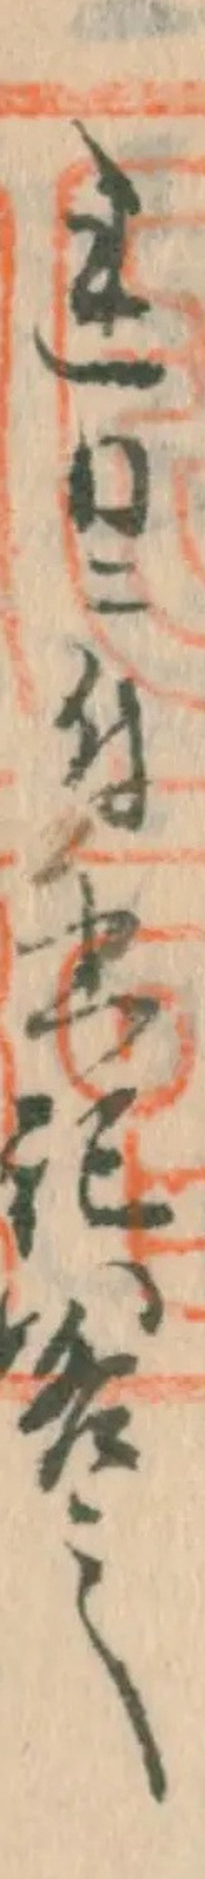連日ニ付書記略之
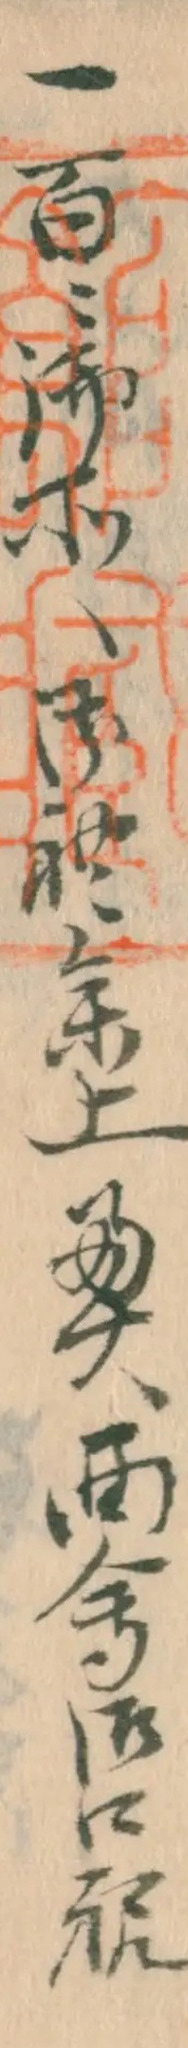一百々御所へ御礼参上奥面会御口祝
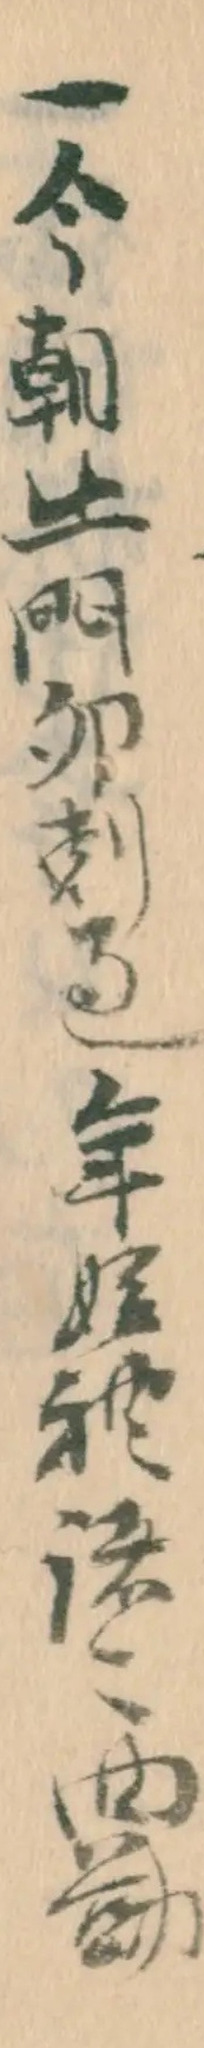一今朝出門卯刻過年始礼諸々回勤
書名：禁裏御所御用日記. [131]
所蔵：国立国会図書館 National Diet Library, JAPAN
